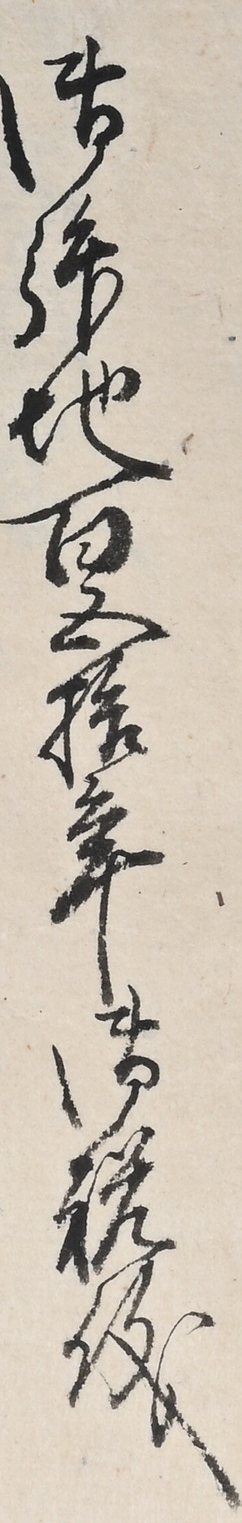御拝地百五拾年御祝儀
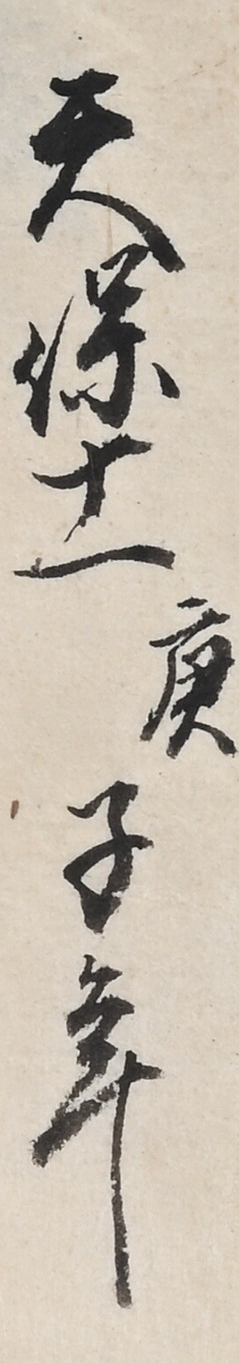天保十一庚子年
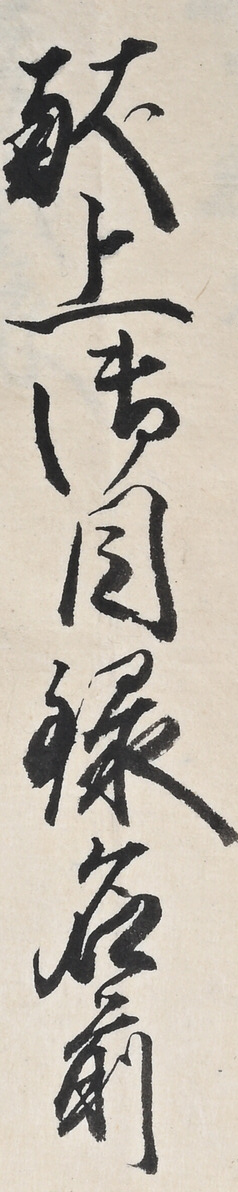献上御目録名前

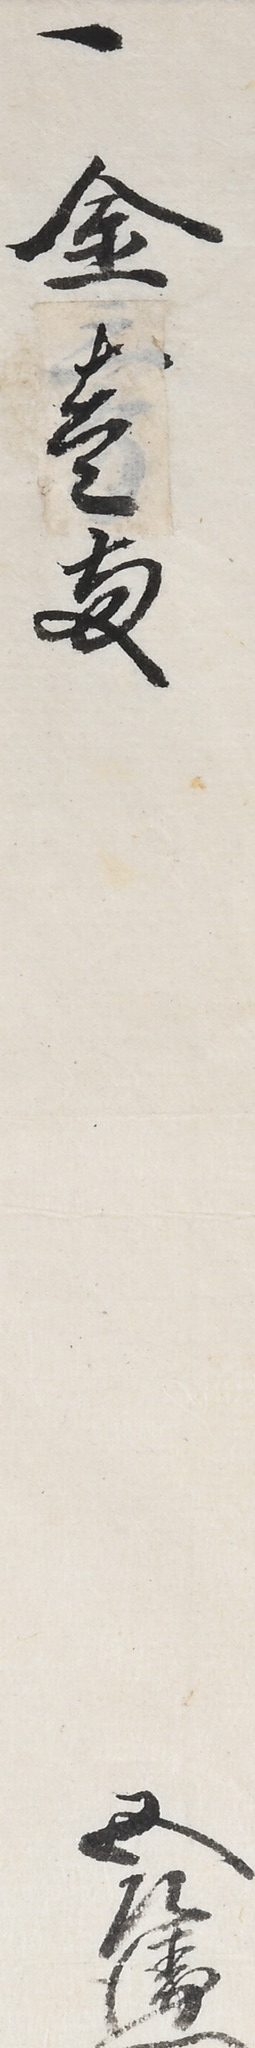一金壱両五左衛門
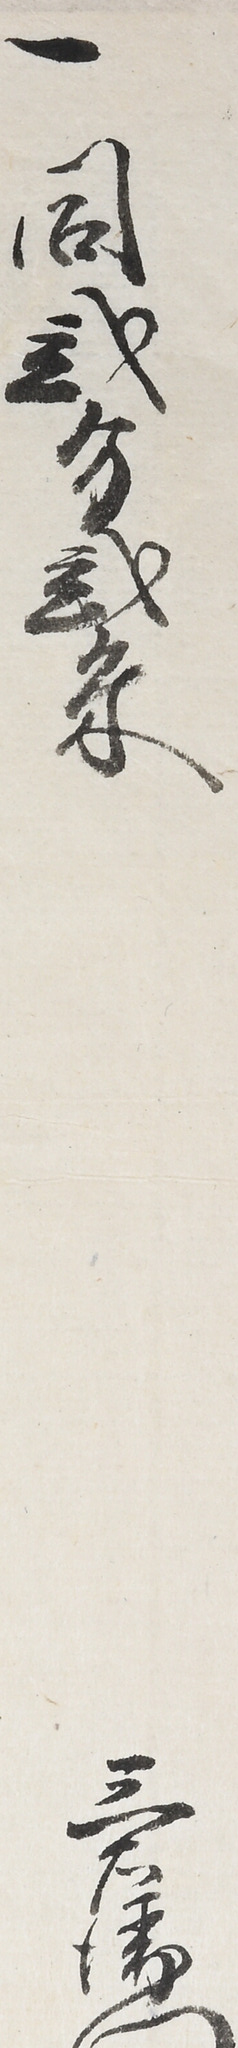一同弐分弐朱三右衛門

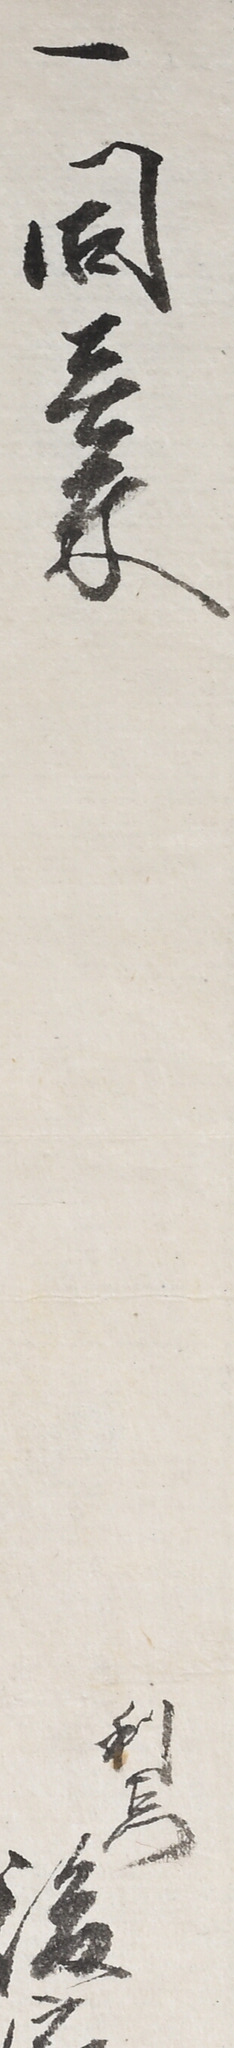一同壱朱利右衛門後家
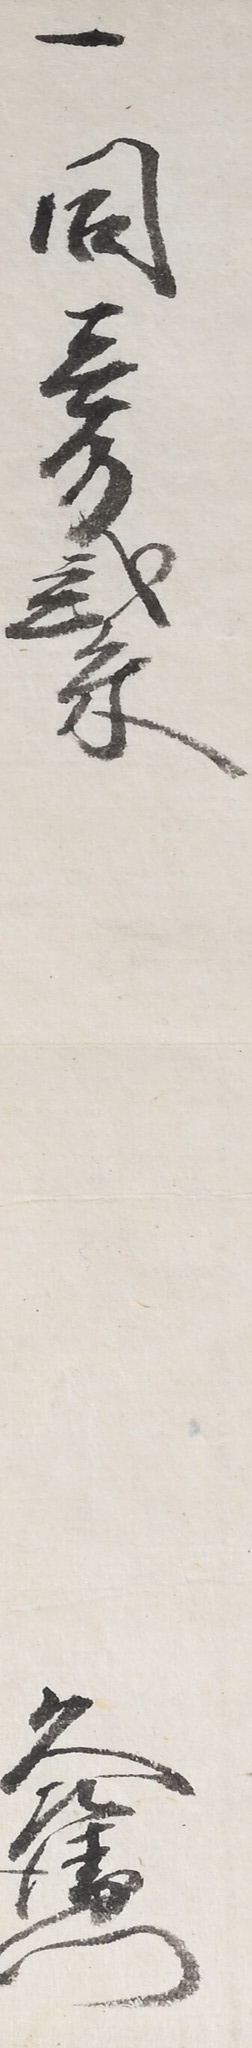一同壱分弐朱久左衛門
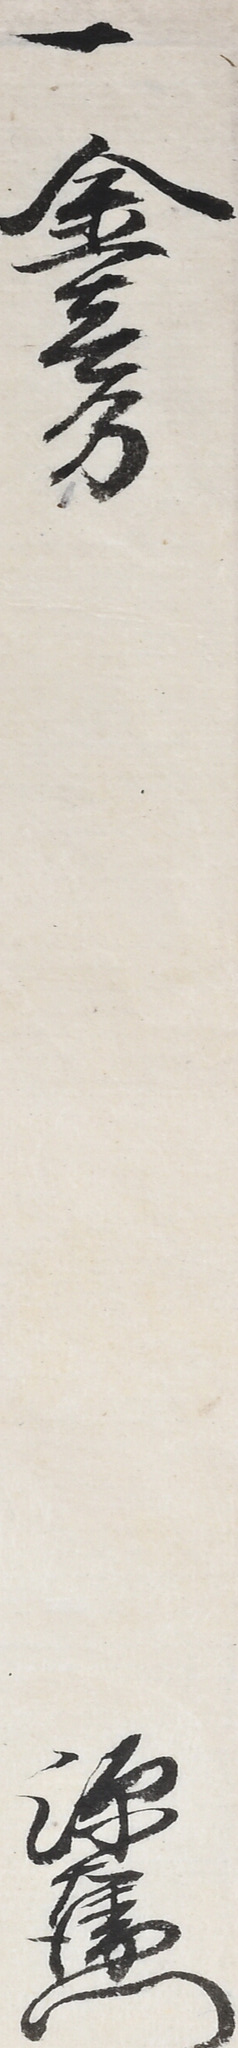一金壱分源右衛門

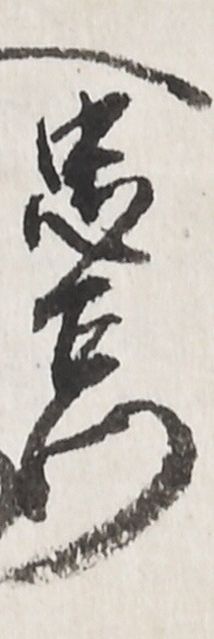忠左衛門
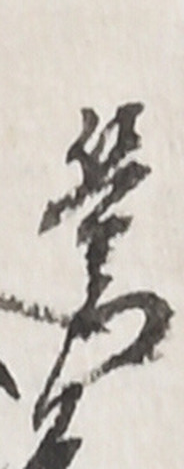若右衛門
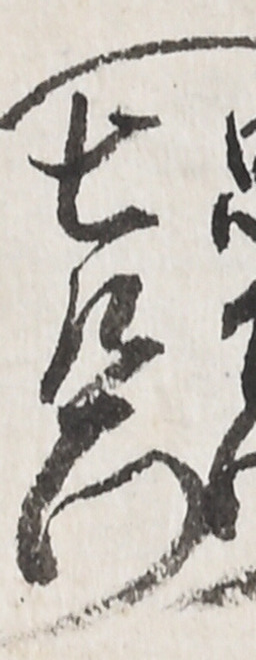七左衛門
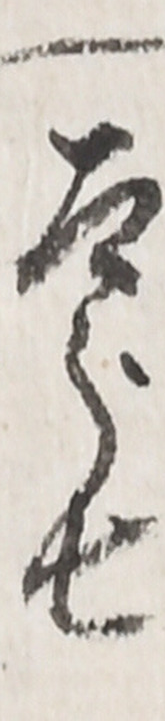太郎七
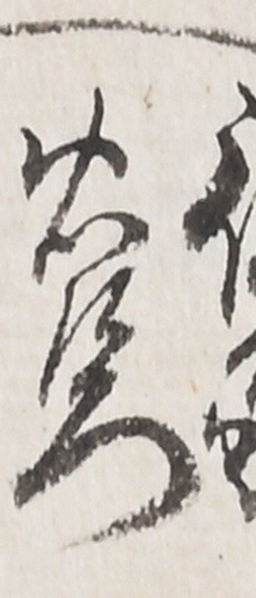忠左衛門
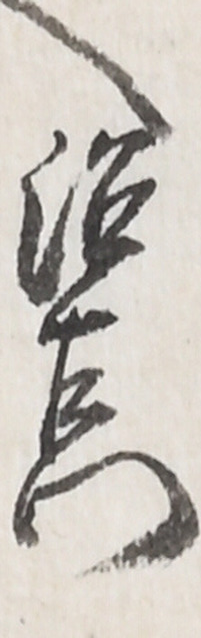治右衛門
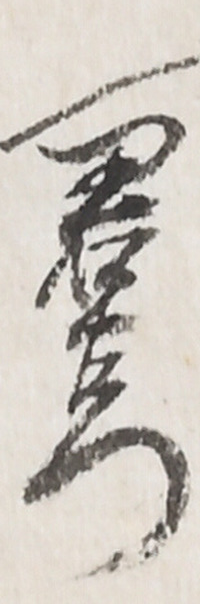若右衛門
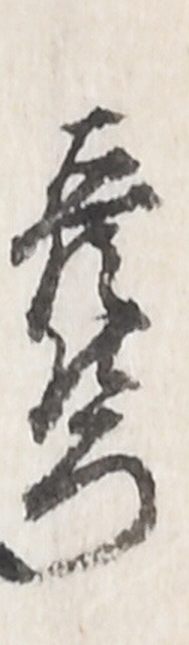七左衛門
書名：御拝地百五拾年御祝儀献上御目録名前
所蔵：伊那市立高遠町図書館・合同会社AMANE
